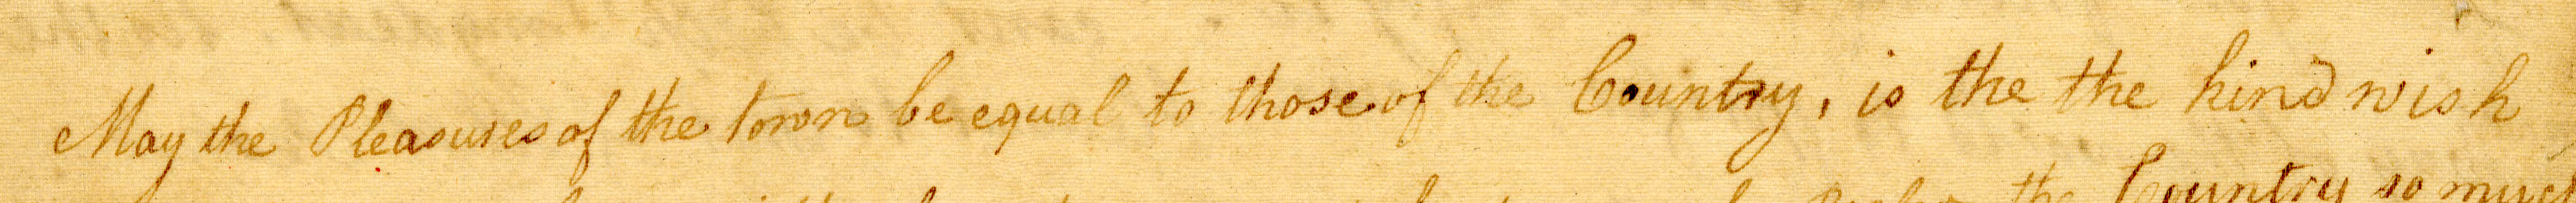May the Pleasures of the town be equal to those of the Country, is the the kind wish
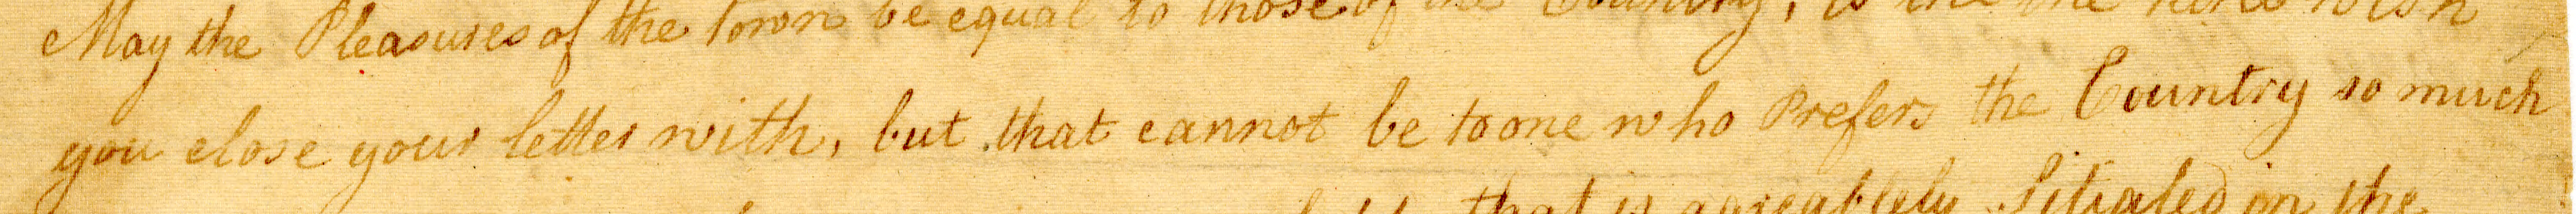you close your letter with, but that cannot be to one who Prefers the Country so much
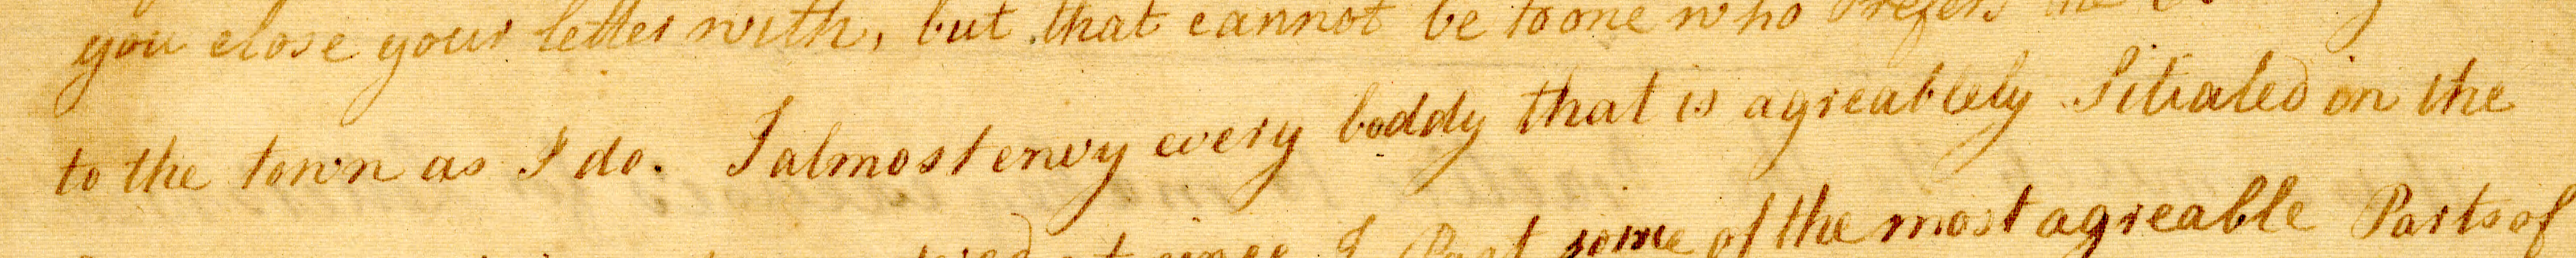to the town as I do. I almost envy every boddy that is agreablely Sitiated in the
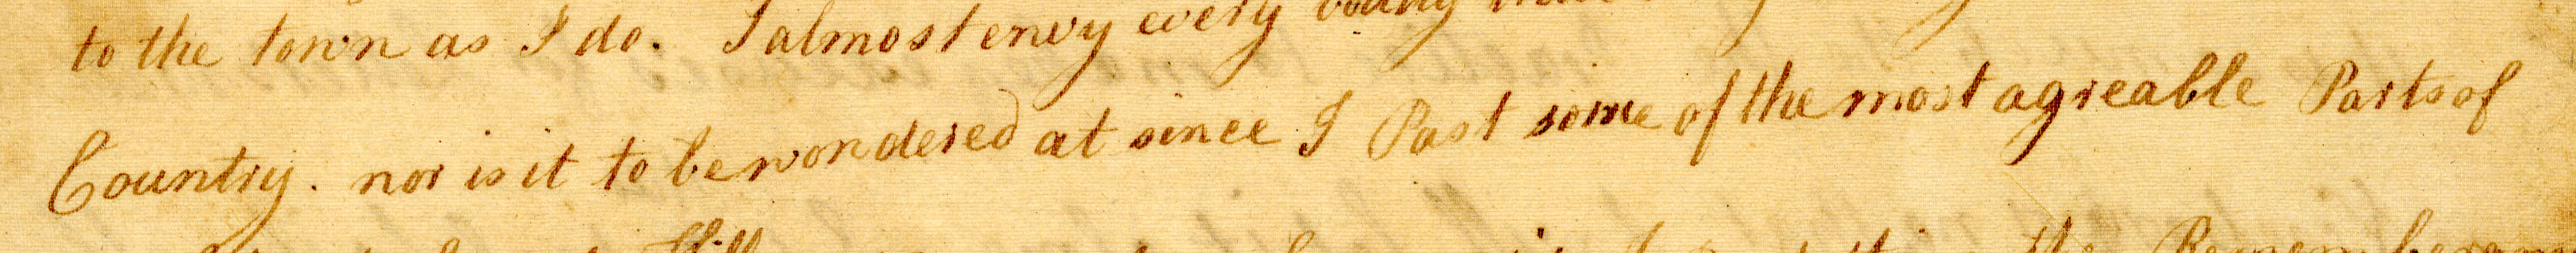Country. nor is it to be wondered at since I Past some of the most agreable Parts of
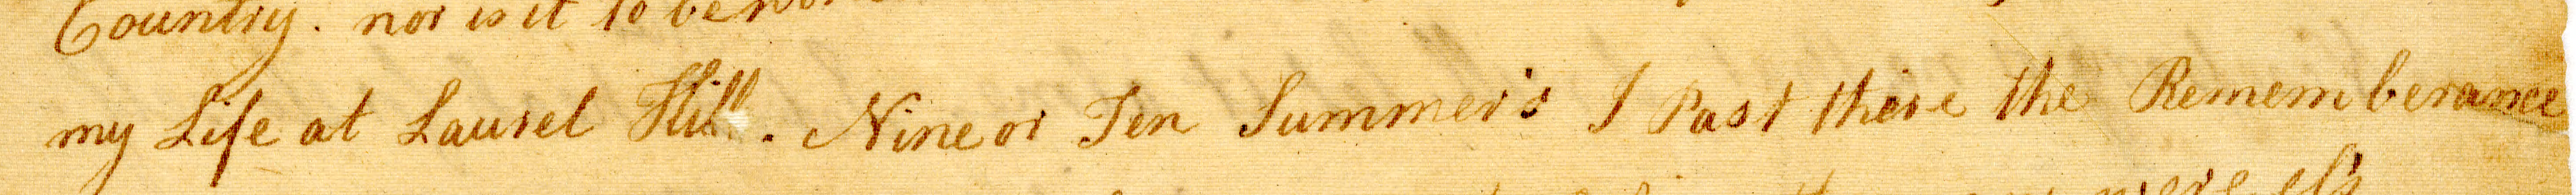my life at Laurel Hill. Nine or Ten Summer's I past there the Rememberance
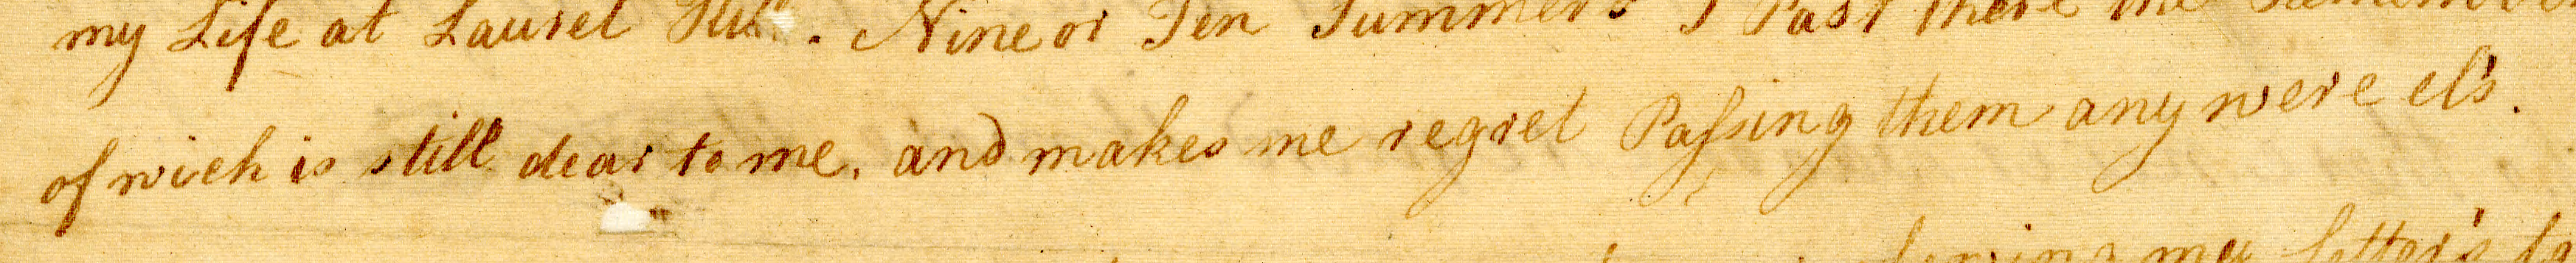of wich is still dear to me, and makes me regret Passing them any were els.
